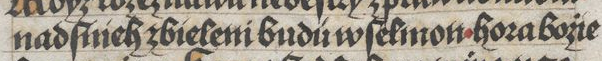nadſníeh zbieleni budú wſelmon.hora bożie
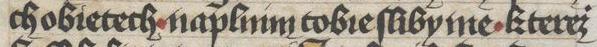ch obietech.naplnim tobie ſliby me.ktereż
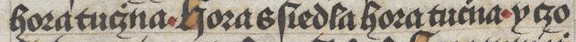hora tucżna.Hora sſiedla hora tuċna.y czo¬
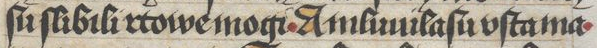ſu ſlibili rtowe mogi.A mluuilaſu uſta ma.
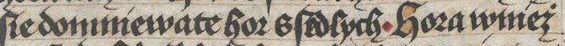ſie domniewate hor sſedlych.Hora wnież
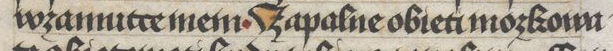wzamutce mem.Zapalne obieti mozkowa
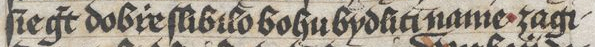ſie ḡt dobṙe ſlibilo bohu bydliti naníe.zagi¬
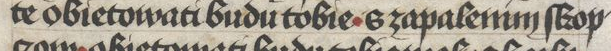te obietowati budu tobie.s zapalením ſkop¬
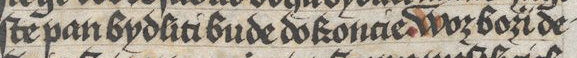ſte pan bydliti bude do koncie.Woz bożi de¬
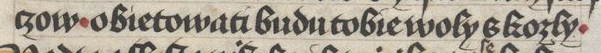czow.obietowati budu tobie woly skozly.
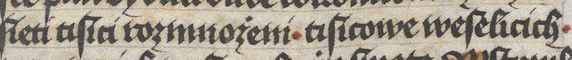ſieti tiſici rozmnożeni.tiſicowe weſelicích.
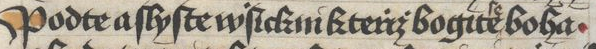Podte a ſlyſte wẛickni kteṙiż bogiēteſe boha.
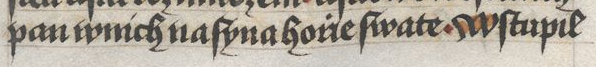pan wnich naſyna hoṙie ſwate.Wſtupil
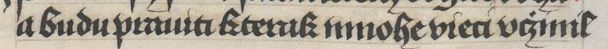a budu prauiti kterak mnohe vieci vcżinil
